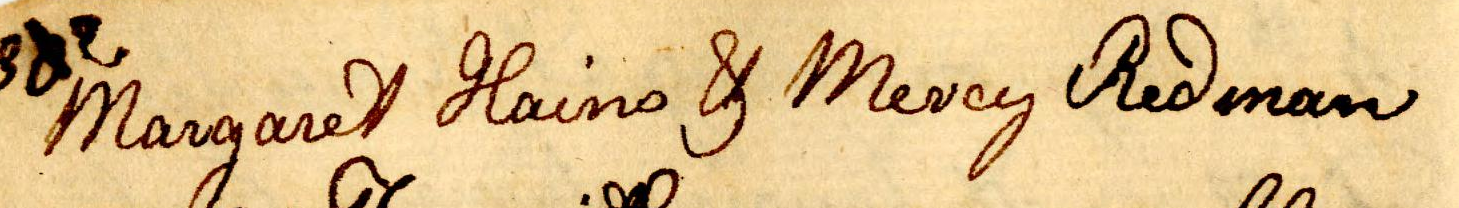Margaret Hains & Mercy Redman
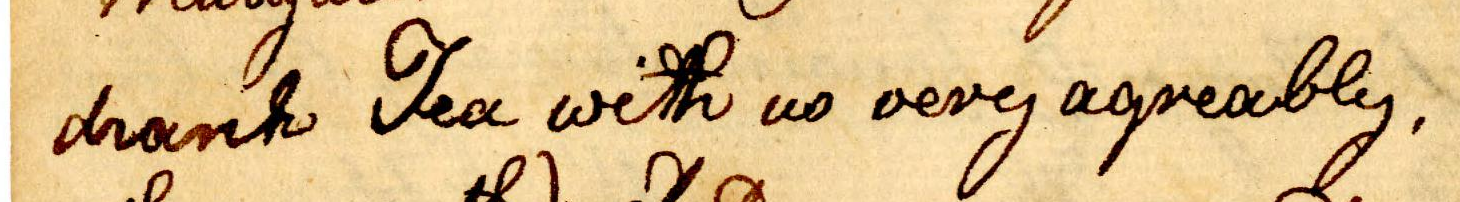drank Tea with us very agreably,
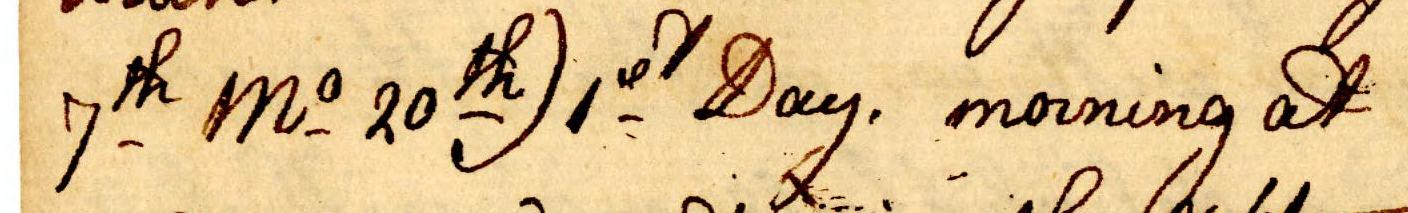7^th M^o 20^th ) 1^st Day. morning at
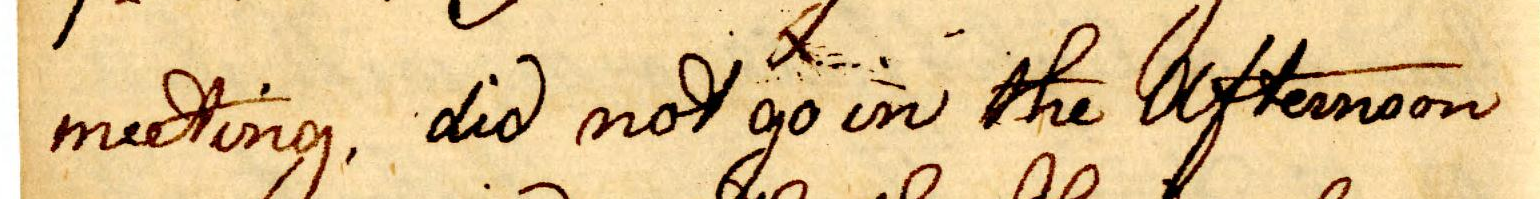meeting, did not go in the Afternoon
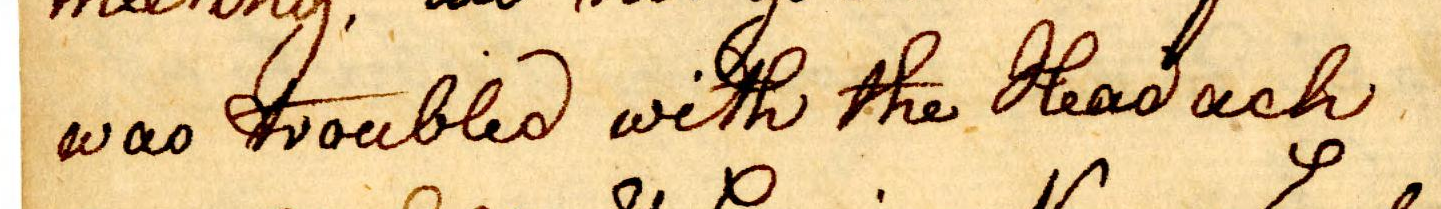was troubled with the Head ach
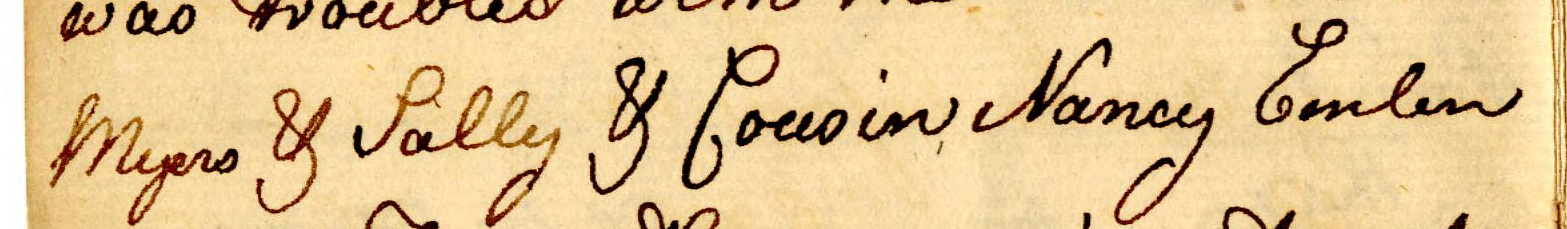Myers & Sally & Cousin Nancy Emlen
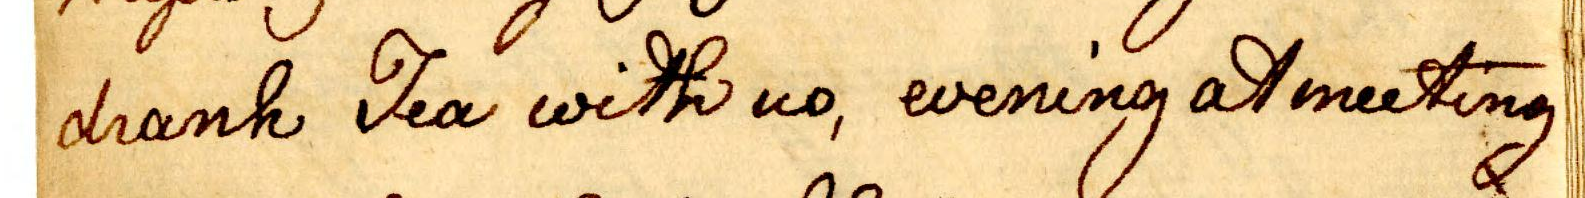drank Tea with us, evening at meeting
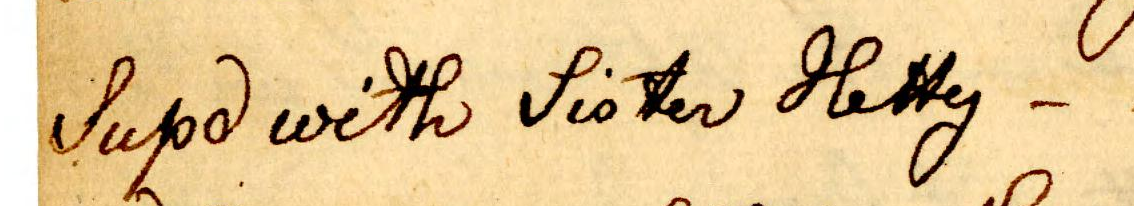Supd with Sister Hetty-
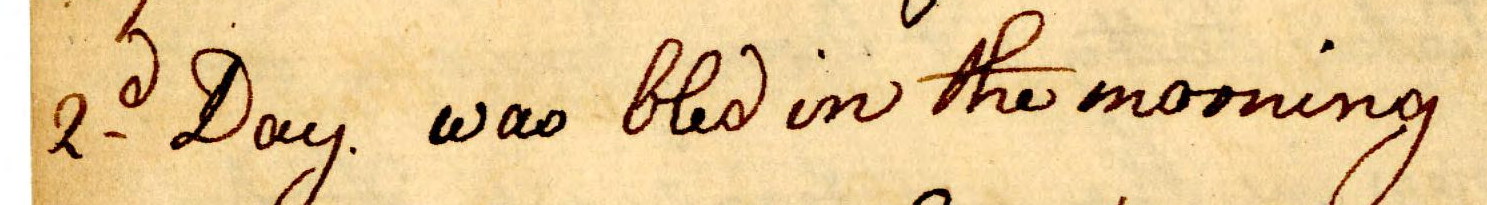2^d Day. was bled in the morning
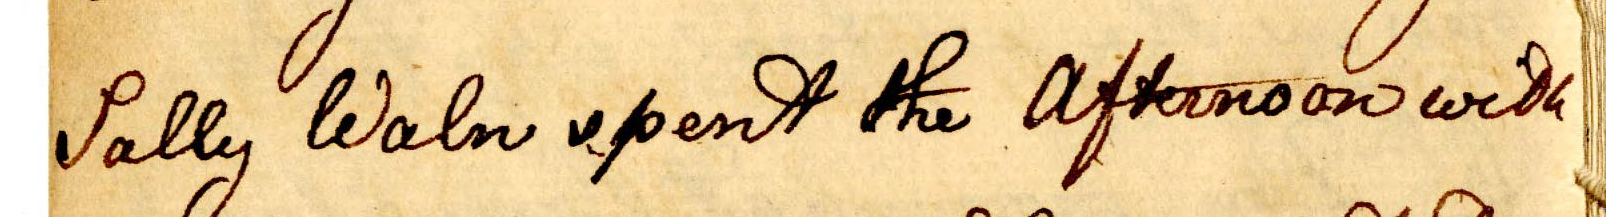Sally Waln spent the Afternoon with
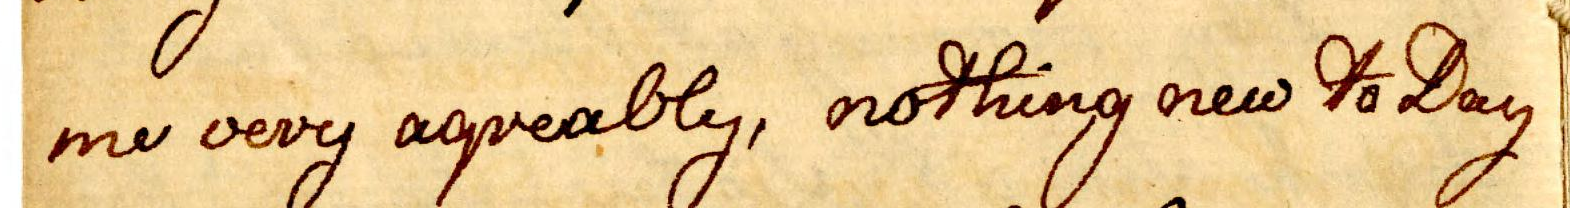me very agreably, nothing new to Day
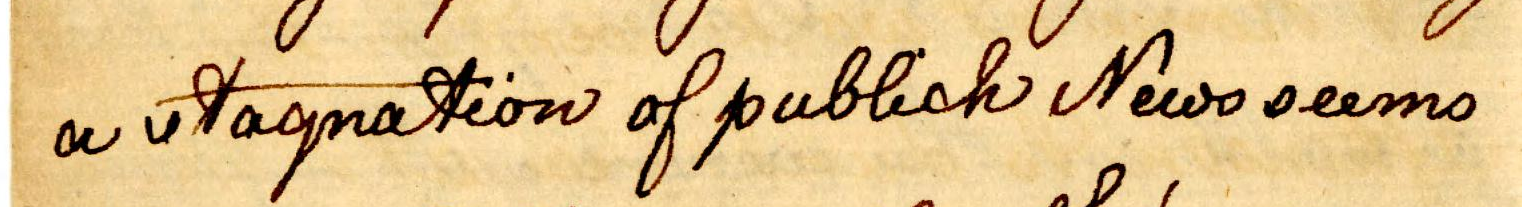a stagnation of publick News seems
